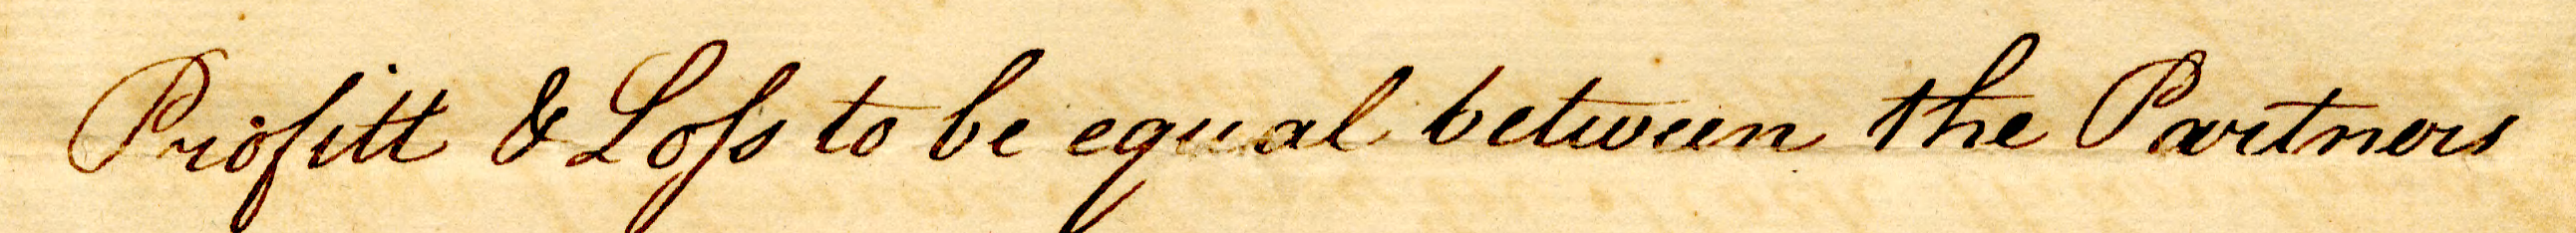Profitt & Loss to be equal between the Partners
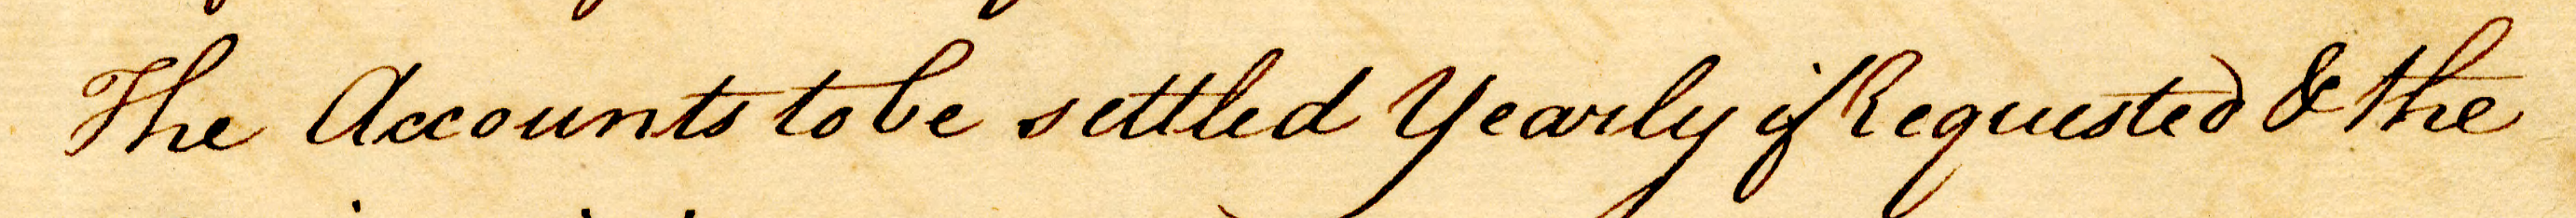The accounts to be settled yearly if Requested & the
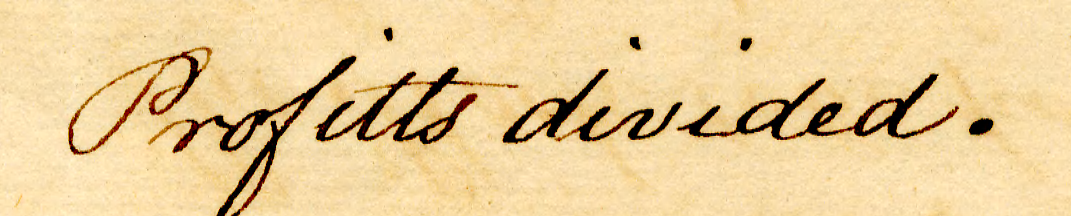Profitts divided.
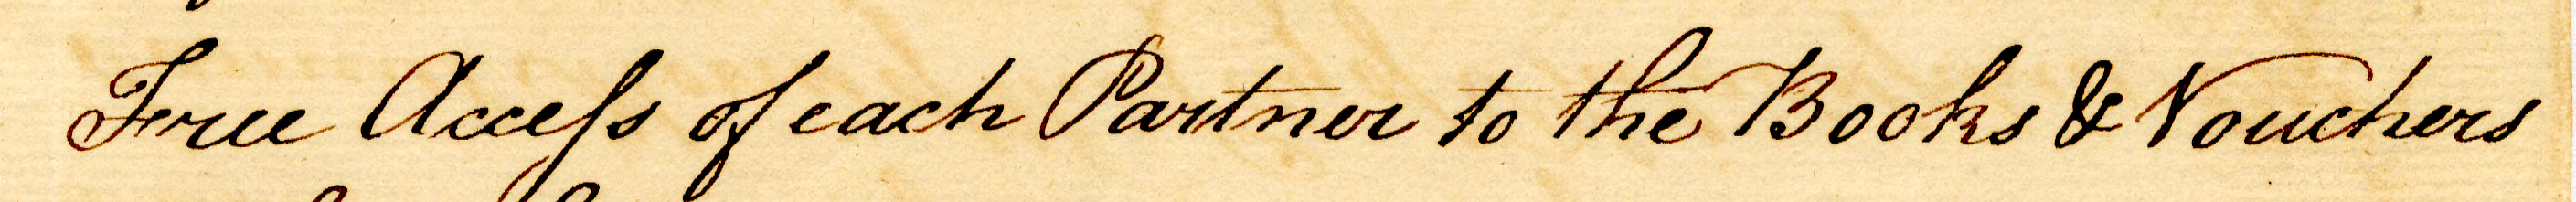Free access of each Partner to the Books & Vouchers
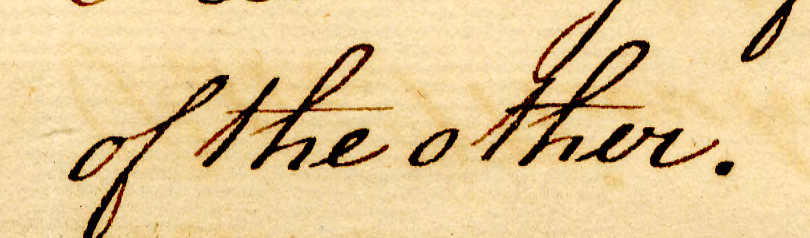of the other.
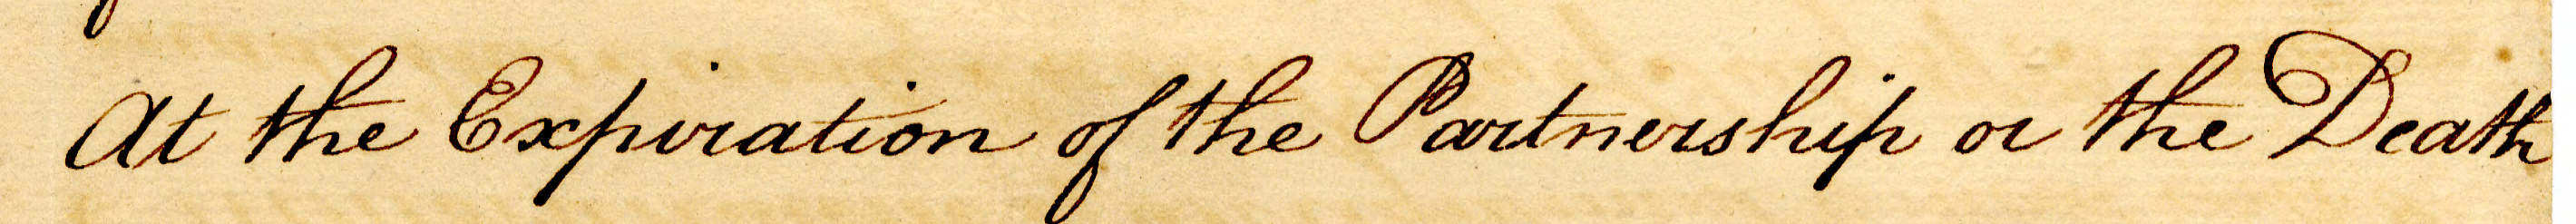At the Expiration of the Partnership or the Death
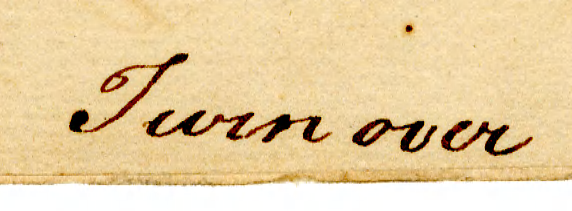Turn over
